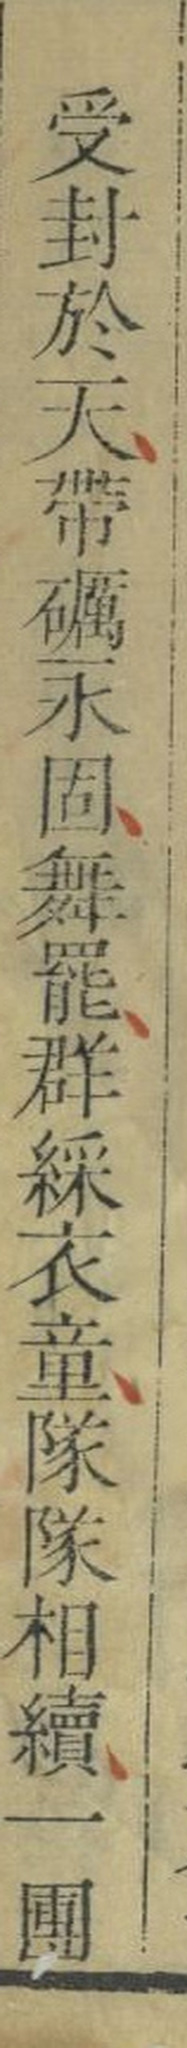受封於天帶礪永固舞罷群綵衣童隊隊相續一團

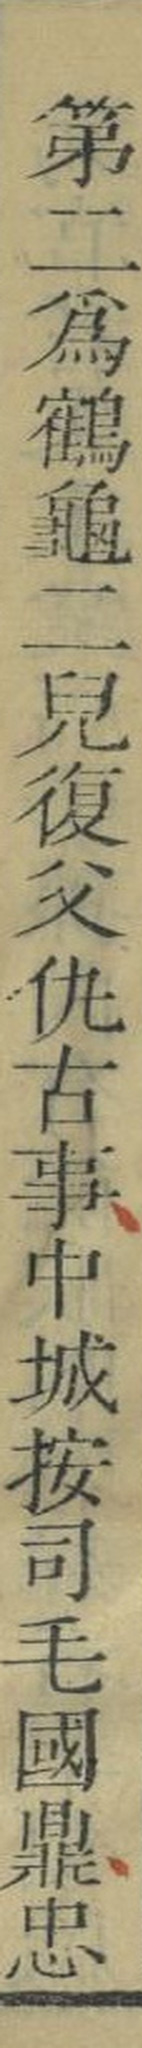第二爲鶴龜二兒復父仇古事中城按司毛國鼎忠
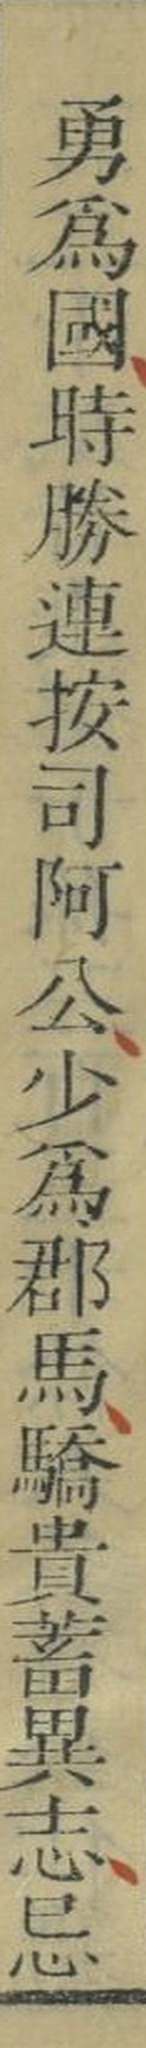勇爲國時勝連按司阿公少爲郡馬驕貴蓄異志忌
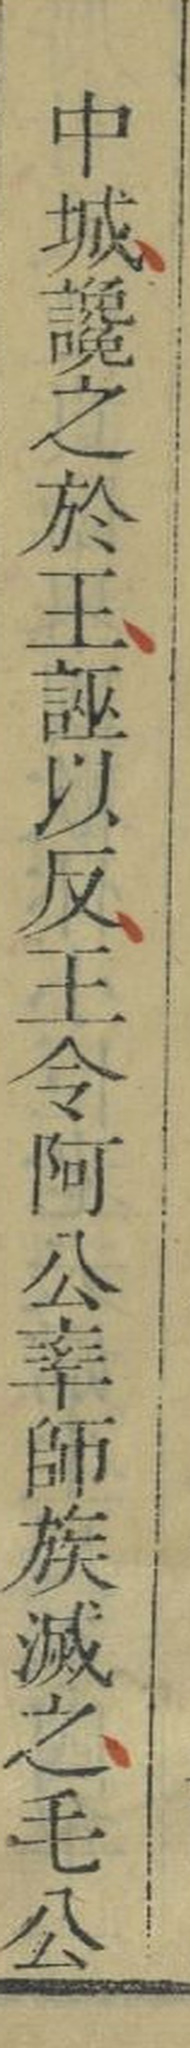中城讒之於王誣以反王令阿公率師族滅之毛公
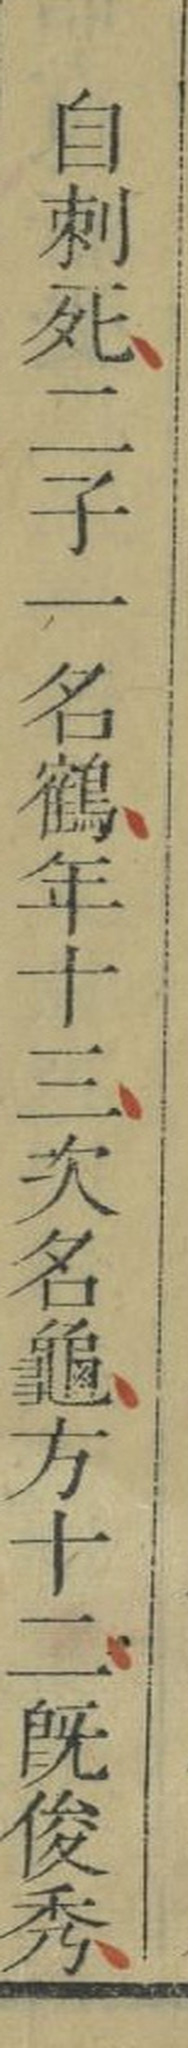自刺死二子一名鶴年十三次名龜方十二既俊秀
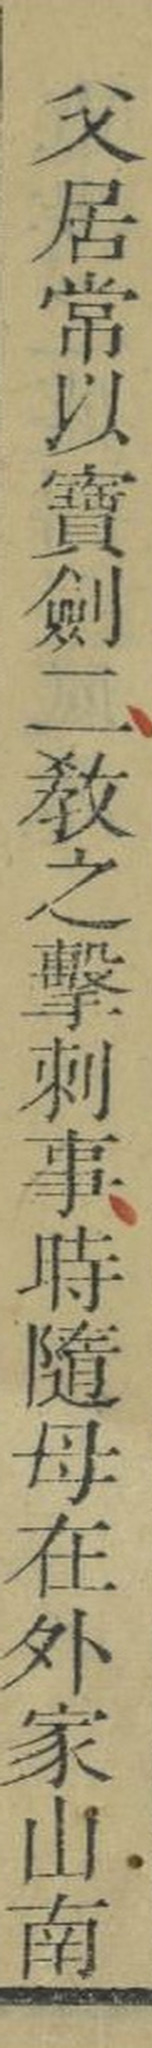父居常以寶劍二敎之擊刺事時隨母在外家山南
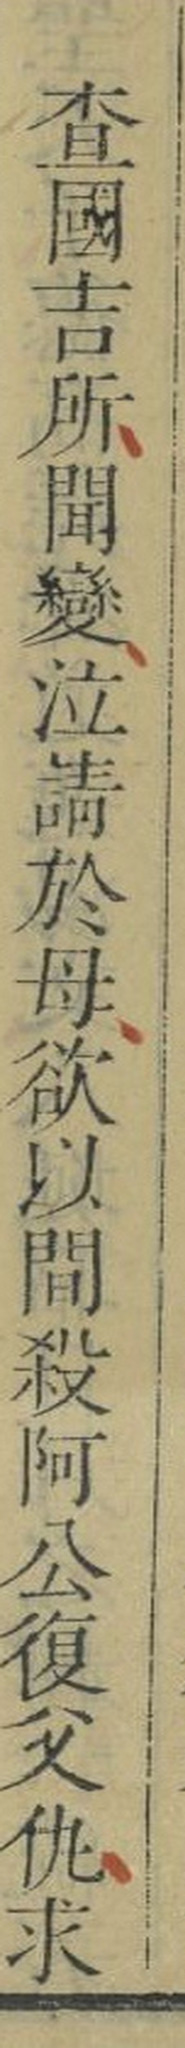査國吉所聞變泣請於母欲以間殺阿公復父仇求
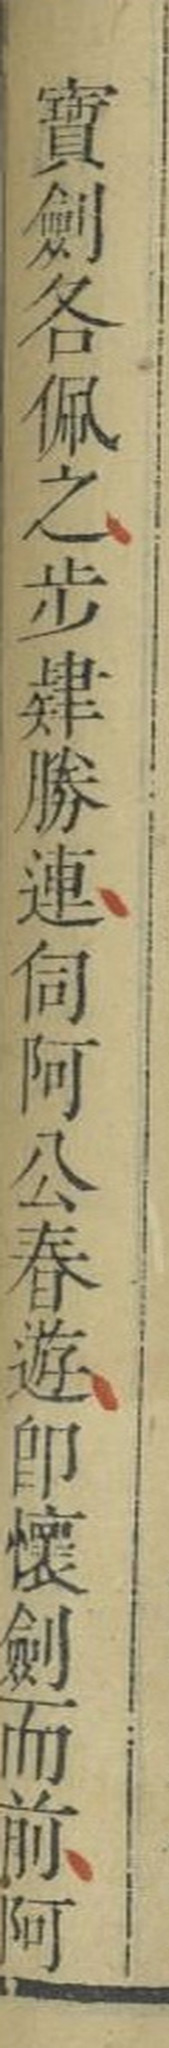寶劍各佩之步肄勝連伺阿公春遊卽懷劍而前阿
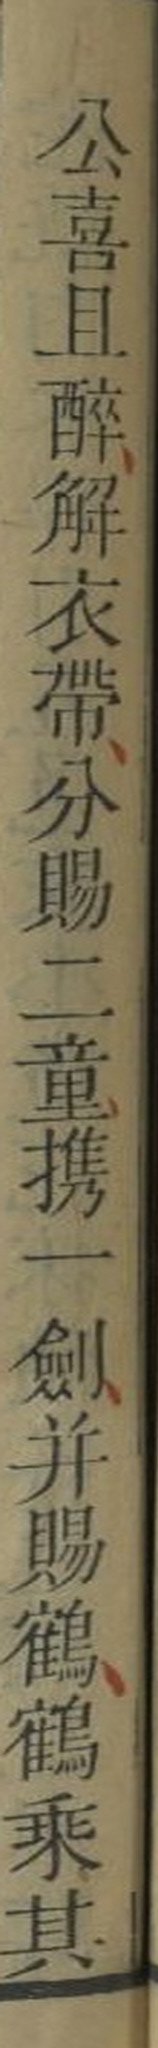公喜且醉解衣帶分賜二童携一劍并賜鶴鶴乘其
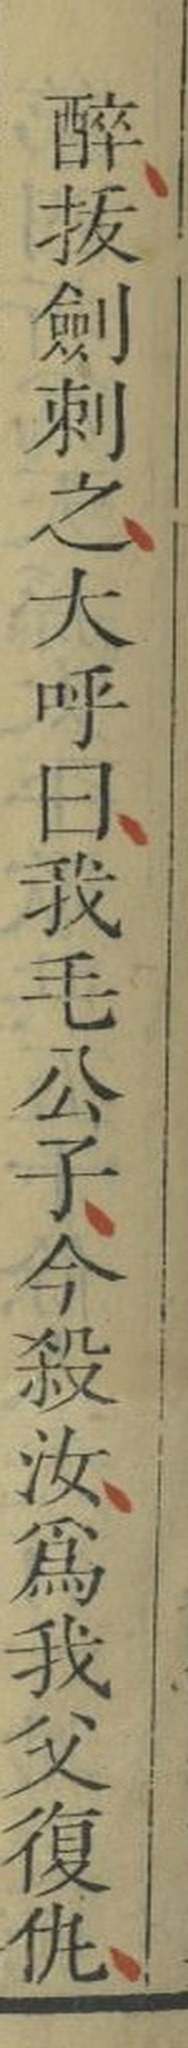醉㧞劍刺之大呼曰我毛公子今殺汝爲我父復仇
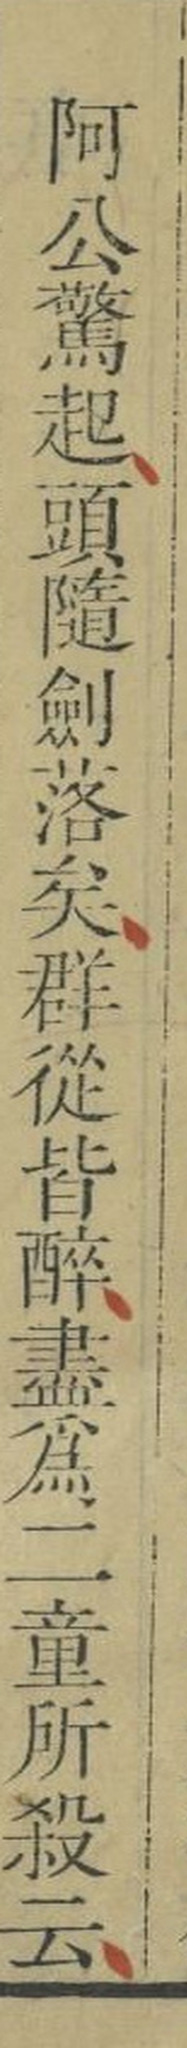阿公驚起頭隨劍落矣群從皆醉盡爲二童所殺云
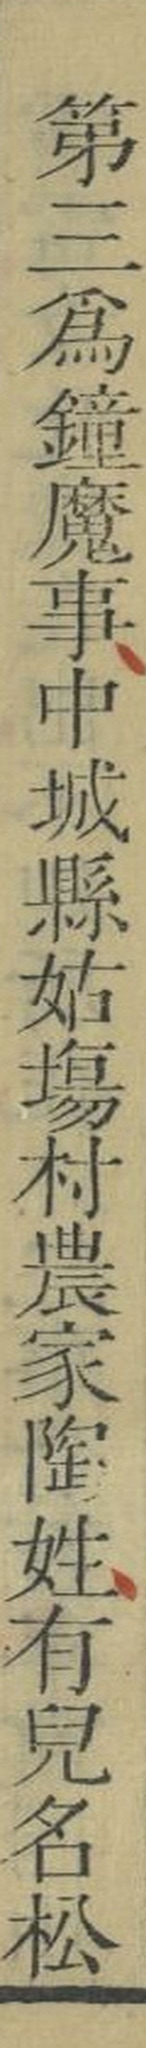第三爲鐘魔事中城縣姑塲村農家陶姓有兒名松
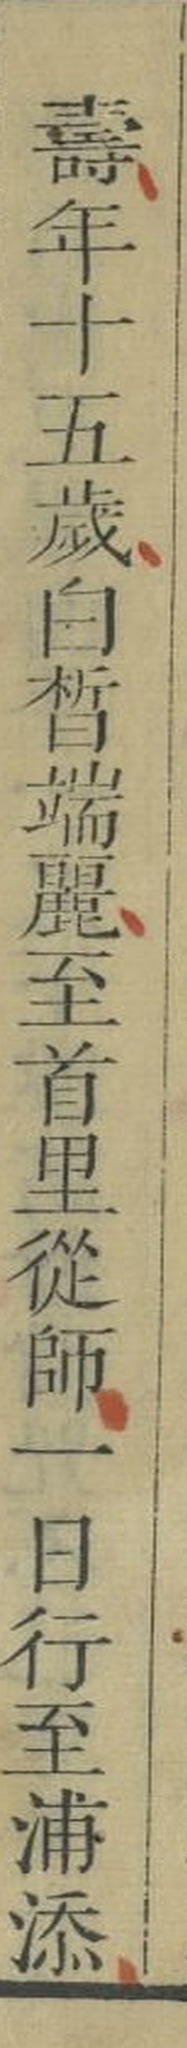壽年十五歲白晳端麗至首里從師一日行至浦添
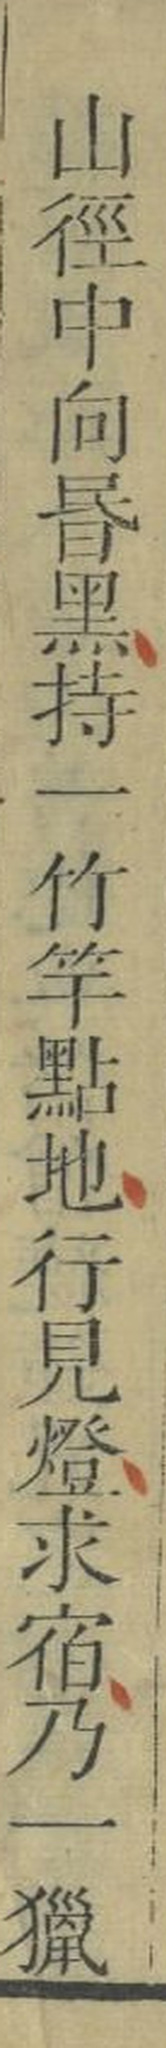山徑中向昬黑持一竹竿點地行見燈求宿乃一獵
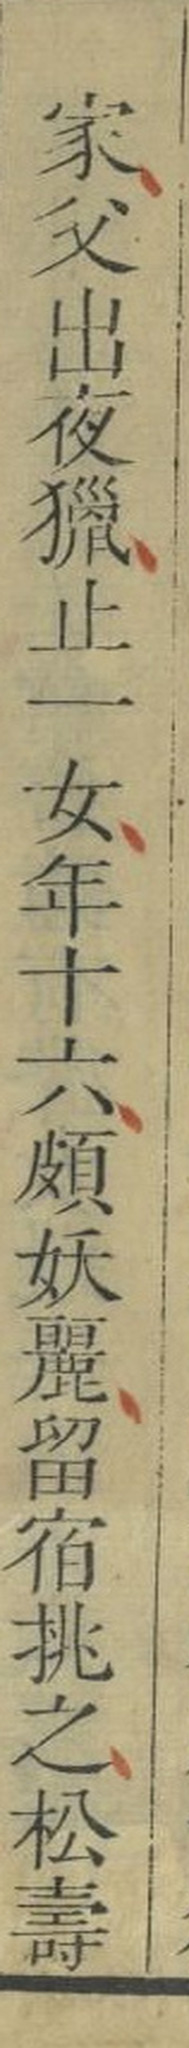家父出夜獵止一女年十六頗妖麗留宿挑之松壽
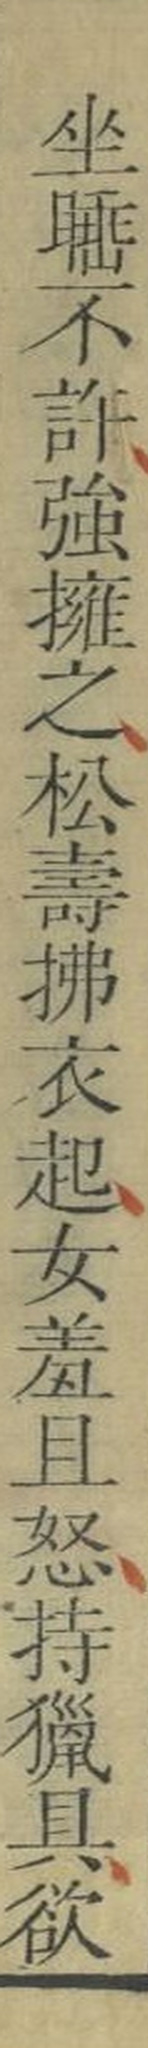坐睡不許強擁之松壽拂衣起女羞且怒持獵具欲
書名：中山伝信録 巻一、巻二
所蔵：University of the Ryukyus Library
